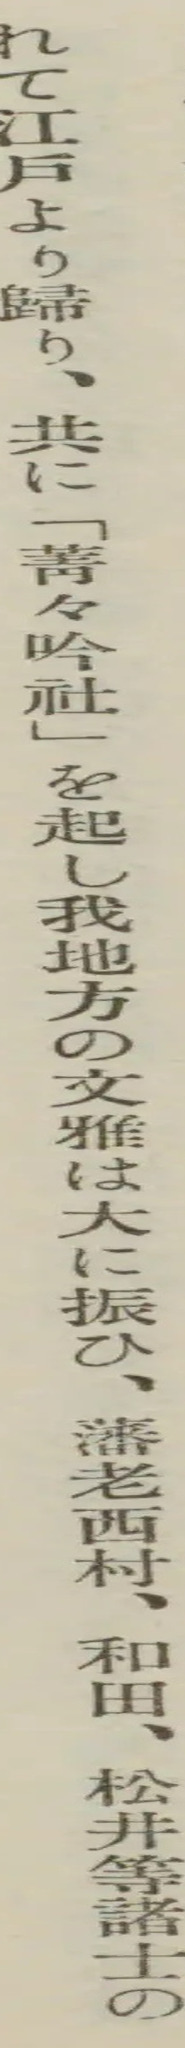れて江戸より帰り、共に「菁々吟社」を起し我地方の文雅は大に振ひ、藩老西村、和田、松井等諸士の
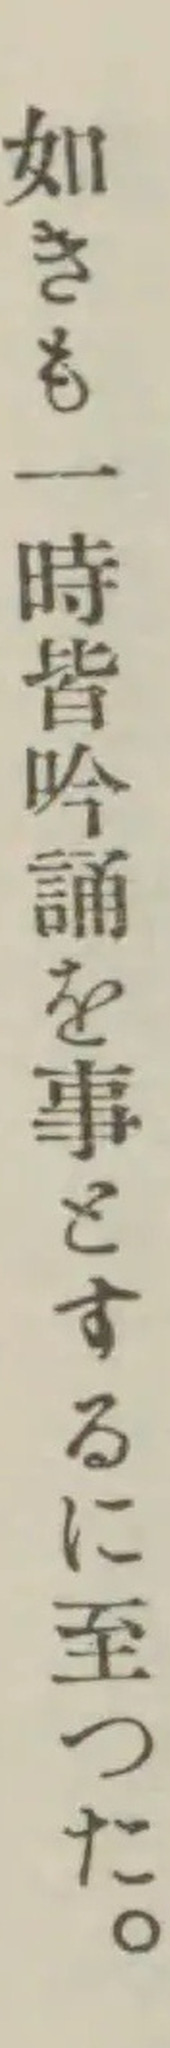如きも一時皆吟誦を事とするに至つた。
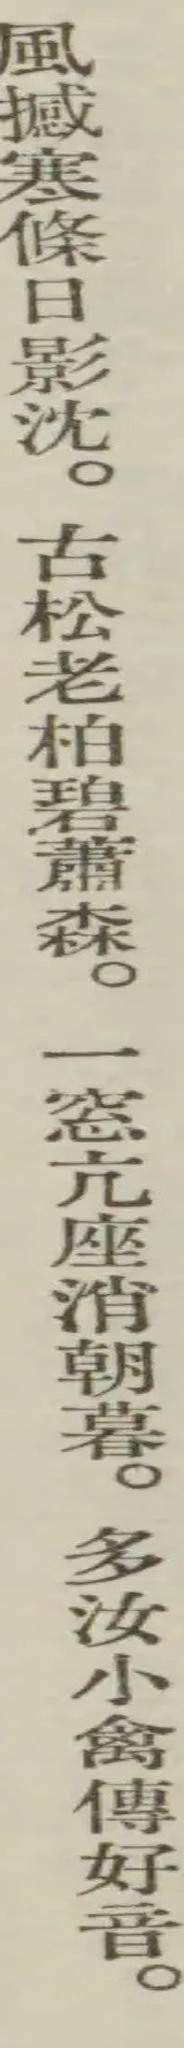風撼寒條日影沈。古松老柏碧蕭森。一窓亢座消朝暮。多汝小禽傳好音。
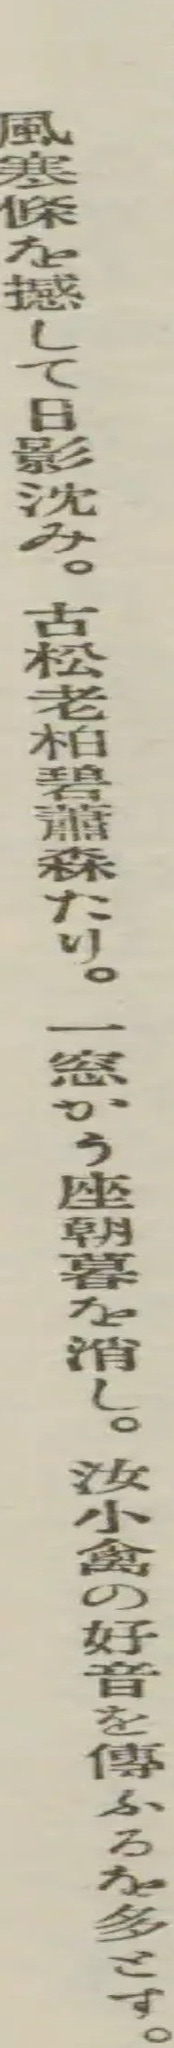風寒條を撼して日影沈み。古松老柏碧蕭森たり。一窓かう座朝暮を消し。汝小禽の好音を伝ふるを多とす。
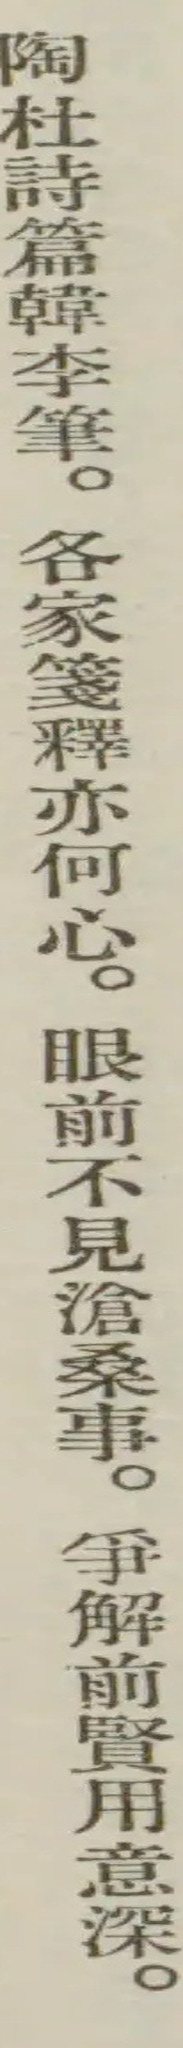陶杜詩篇韓李筆。各家箋釋亦何心。眼前不見滄桑事。爭解前賢用意深。
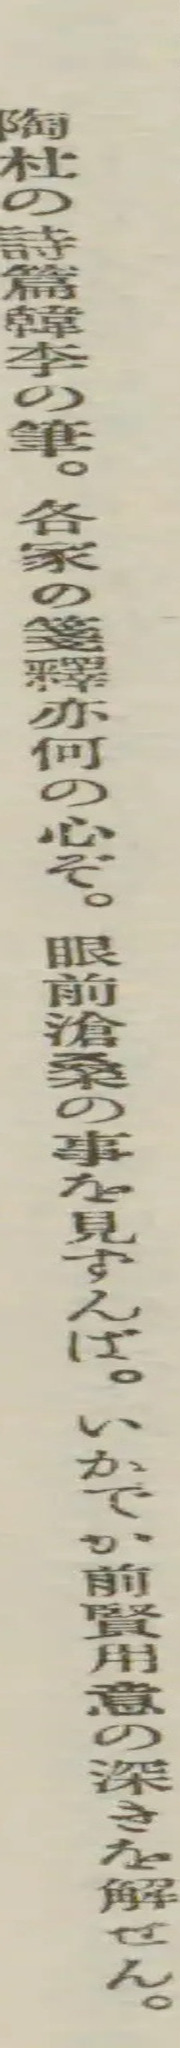陶杜の詩篇韓李の筆。各家の箋釋亦何の心ぞ。眼前滄桑の事を見ずんば。いかでか前賢用意の深きを解せん。
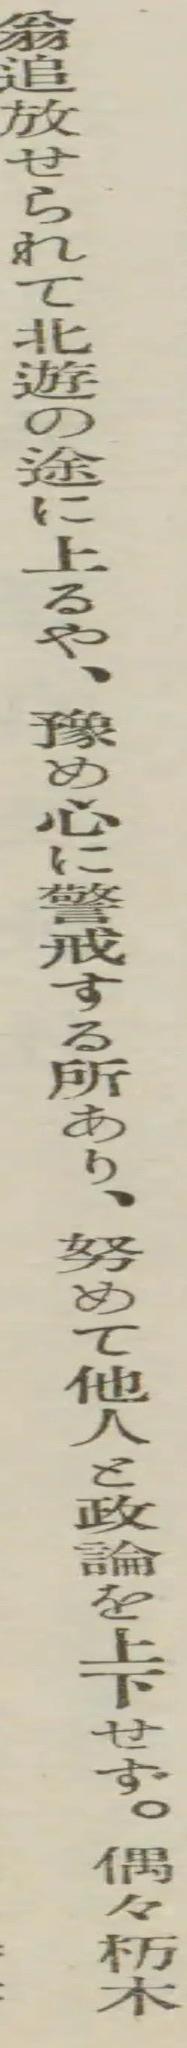翁追放せられて北遊の途に上るや、予め心に警戒する所あり、努めて他人と政論を上下せず。偶々栃木
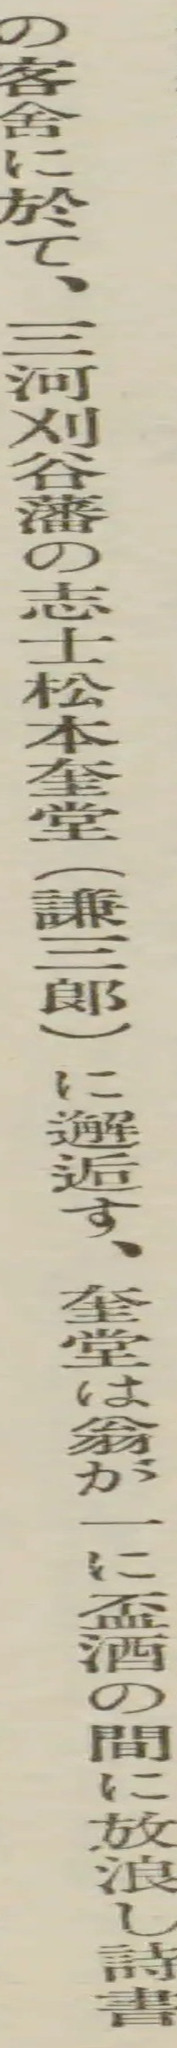の客舎に於て、三河刈谷藩の志士松本奎堂(謙三郎)に邂逅す、奎堂は翁が一に盃酒の間に放浪し詩書
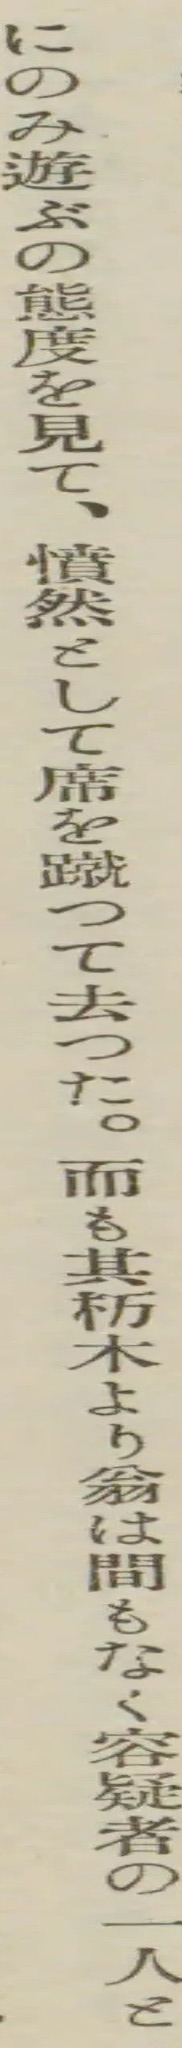にのみ遊ぶの態度を見て、憤然として席を蹴つて去つた。而も其栃木より翁は間もなく容疑者の一人と
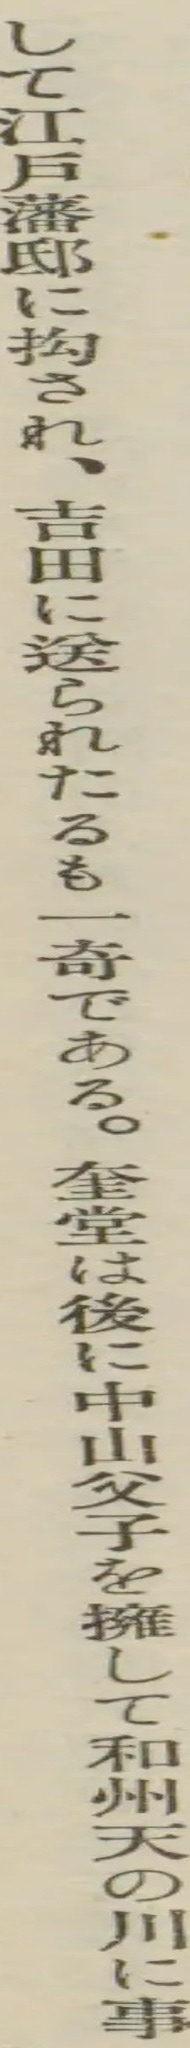して江戸藩邸に拘され、吉田に送られたるも一奇である。奎堂は後に中山父子を擁して和州天の川に事

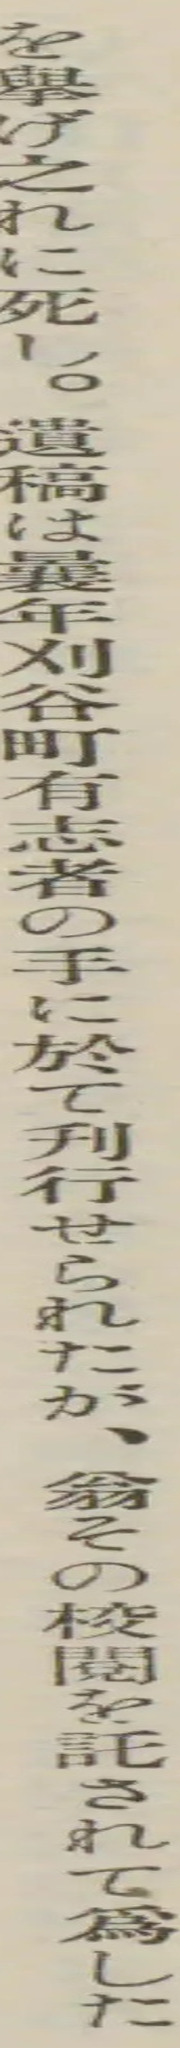を挙げ之れに死し。遺稿は曩年刈谷町有志者の手に於て刊行せられたが、翁その校閲を託されて為した
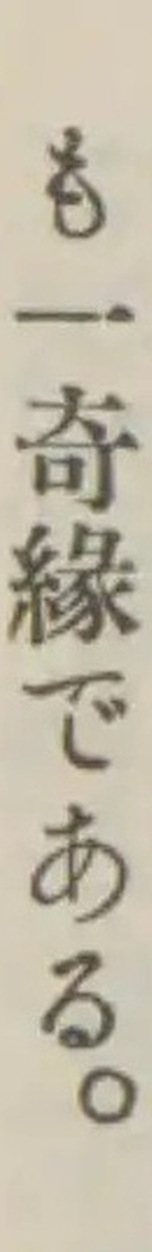も一寄縁である。
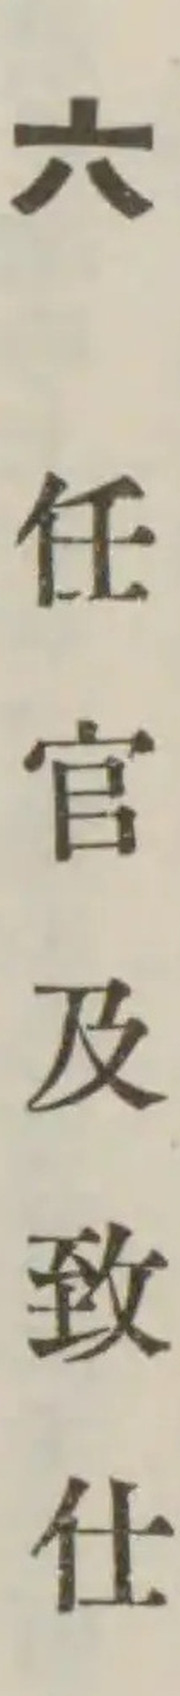六任官及致仕
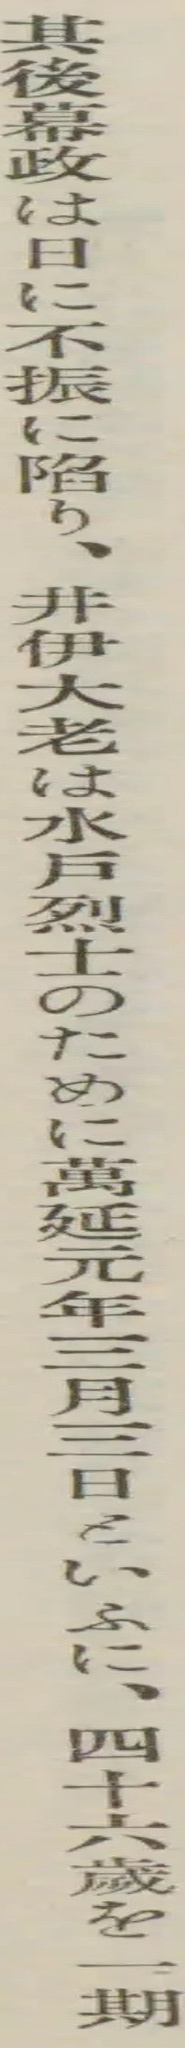其後幕政は日に不振に陥り、井伊大老は水戸烈士のために萬延元年三月三日といふに、四十六歳を一期
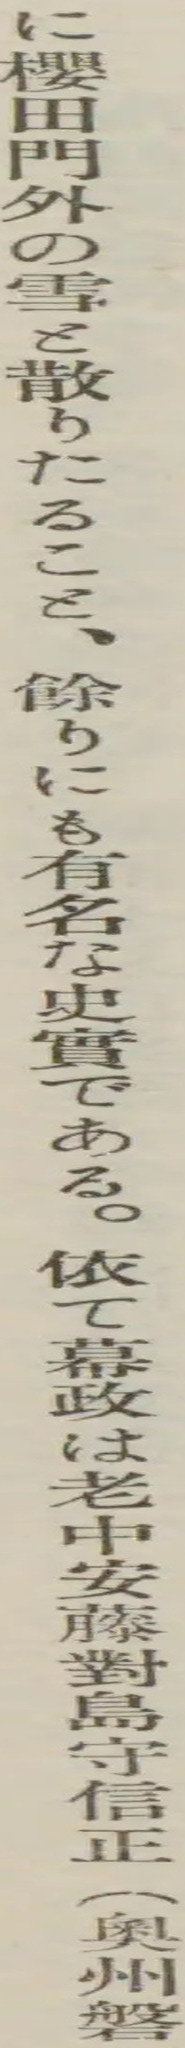に桜田門外の雪と散りたること、余りにも有名な史実である。依て幕政は老中安藤對馬守信正(奥州磐
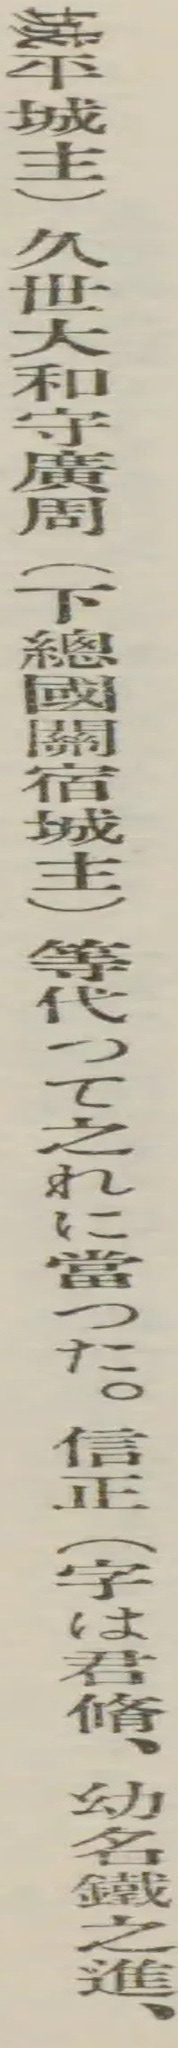城平城主)久世大和守廣周(下総国関宿城主)等代つて之れに当つた。信正(字は君脩、幼名鐵之進、
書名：小野湖山翁小伝
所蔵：国立国会図書館 National Diet Library, JAPAN
